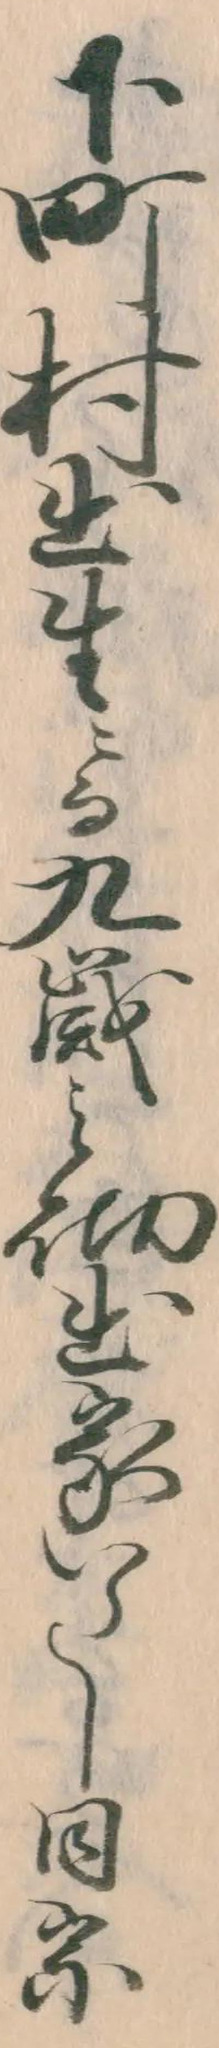下町村出生ニ而九歳之砌出家いたし同宗
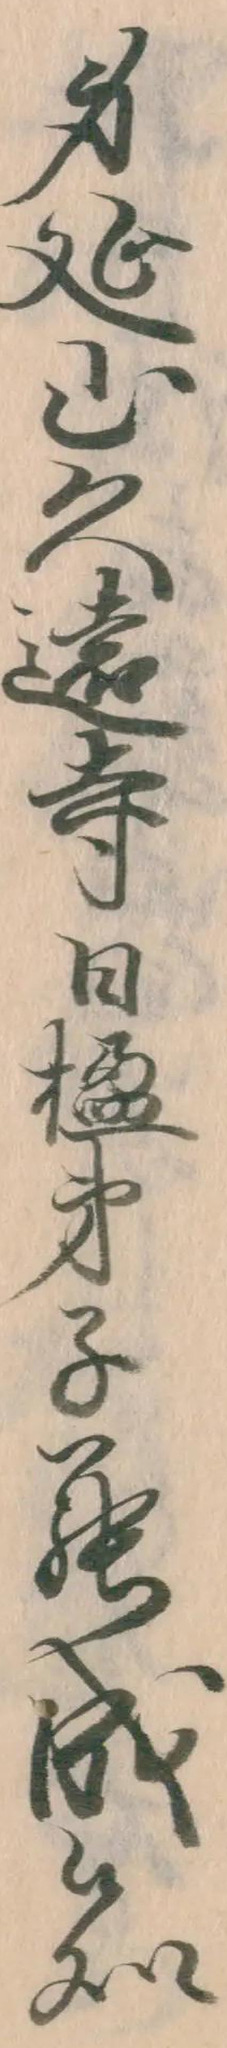身延山久遠寺日楹弟子罷成候処
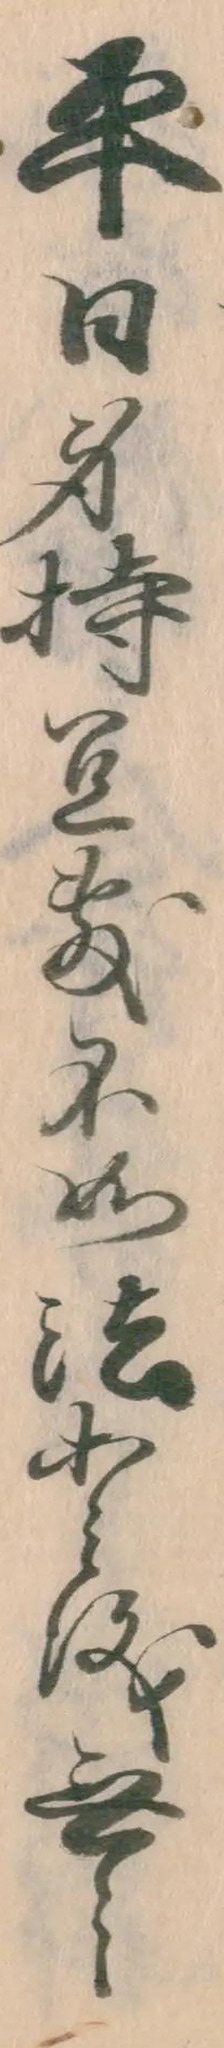平日身持宜敷不如法等之儀無之
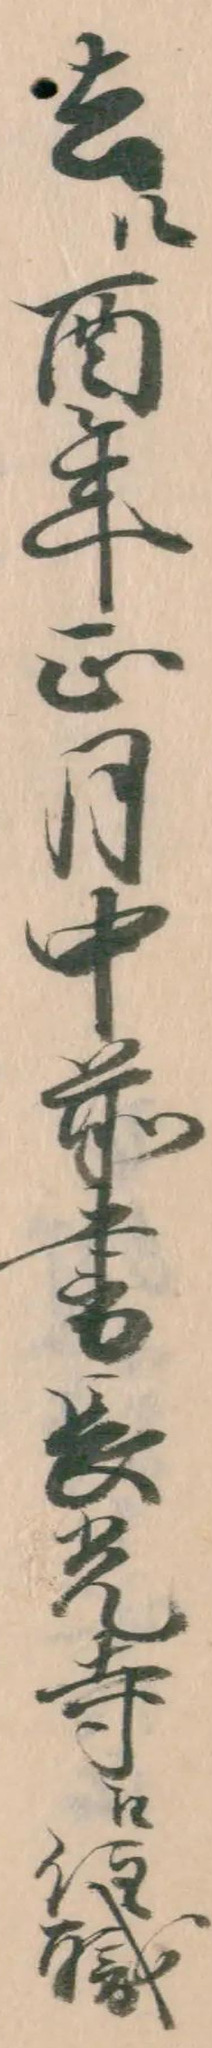去ル酉年正月中前書長光寺え住職
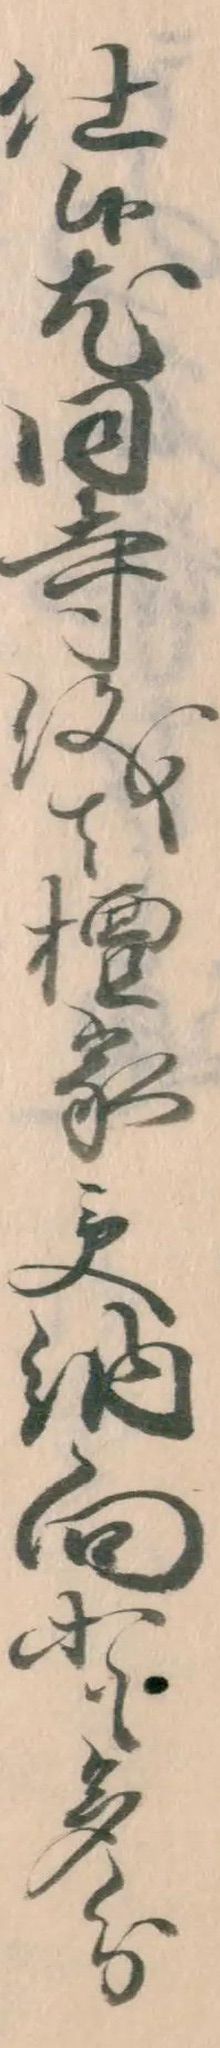仕候尤同寺儀は檀家受納向等も多分
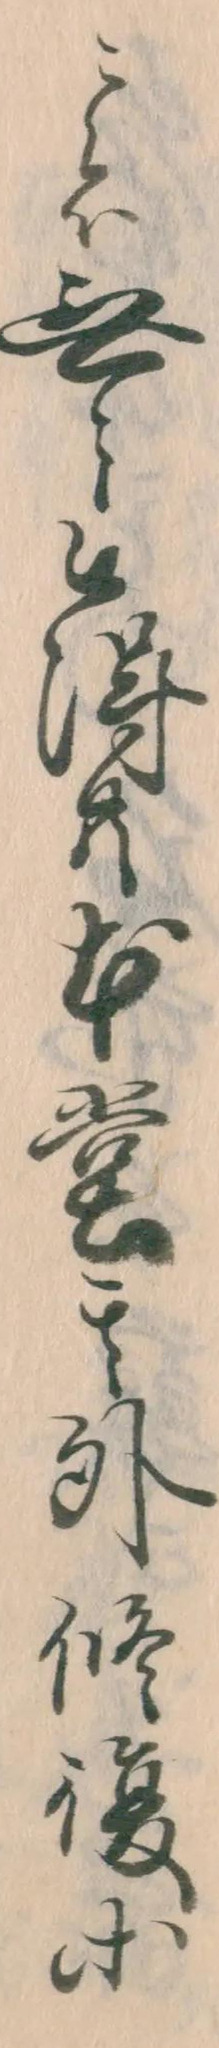ニは無之候得共本堂其外修復等
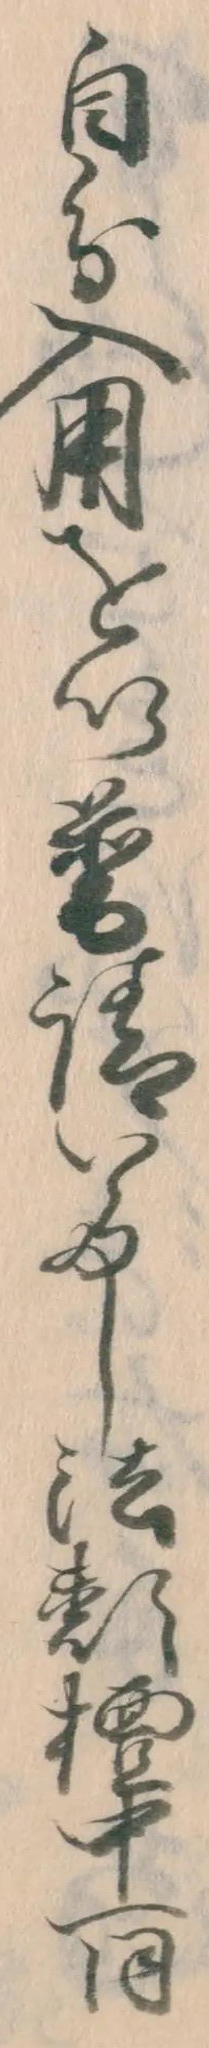自分入用を以普請いたし法類檀中一同
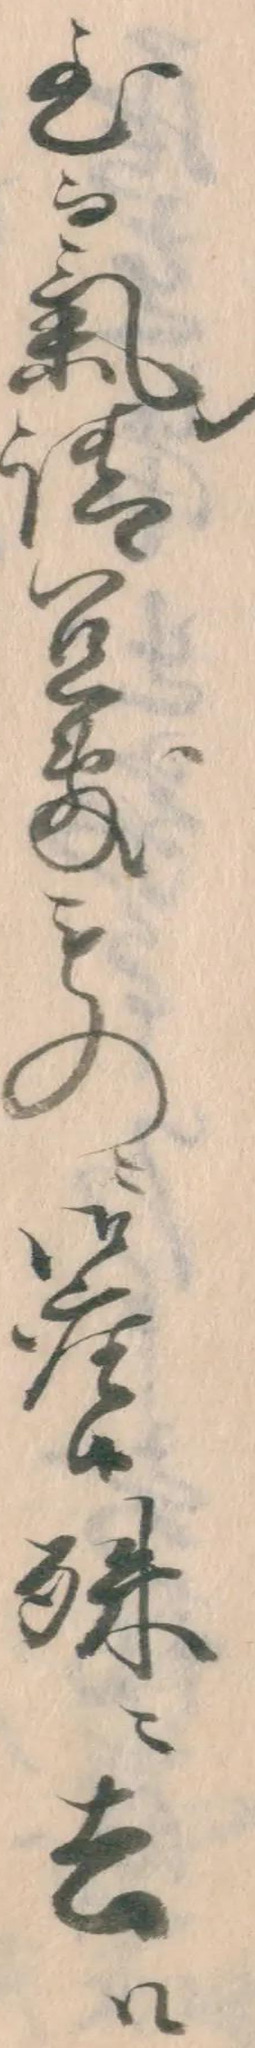至而気請宜敷ものニ御座候殊ニ去ル
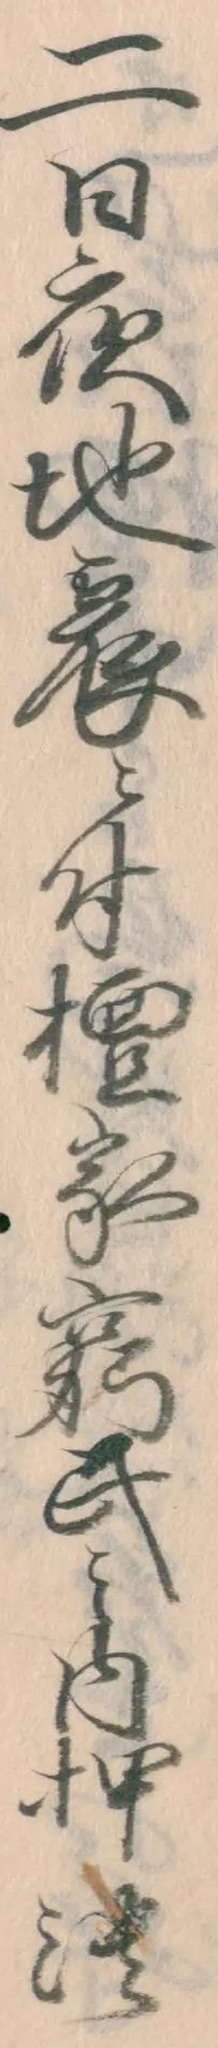二日夜地震ニ付檀家窮民之内押潰
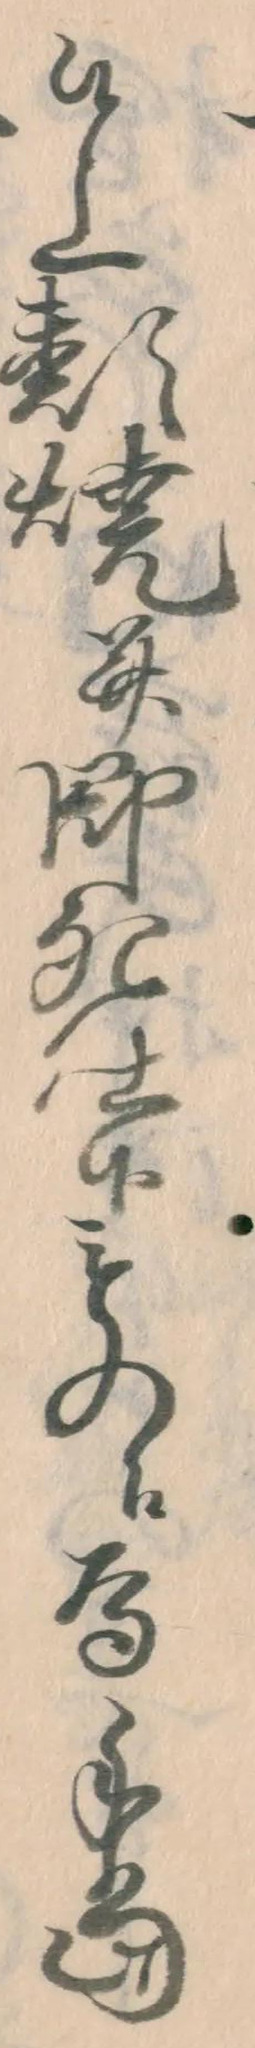候上類焼并即死仕候ものえ為手当
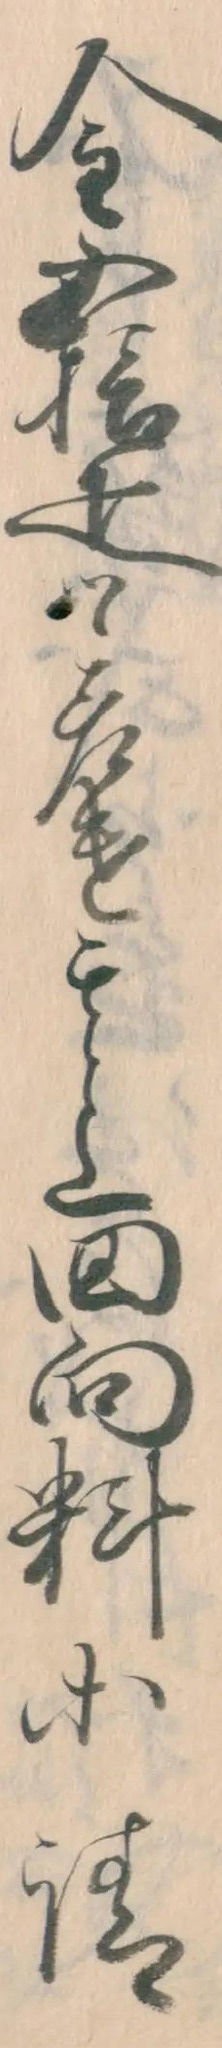金五拾疋ツヽ差遣其上回向料等請

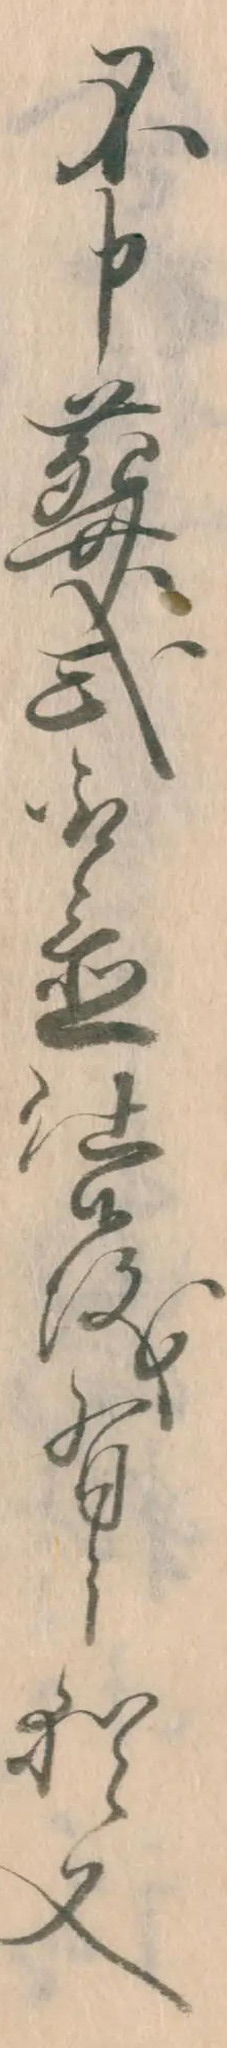不申葬式取置仕候儀有之猶又
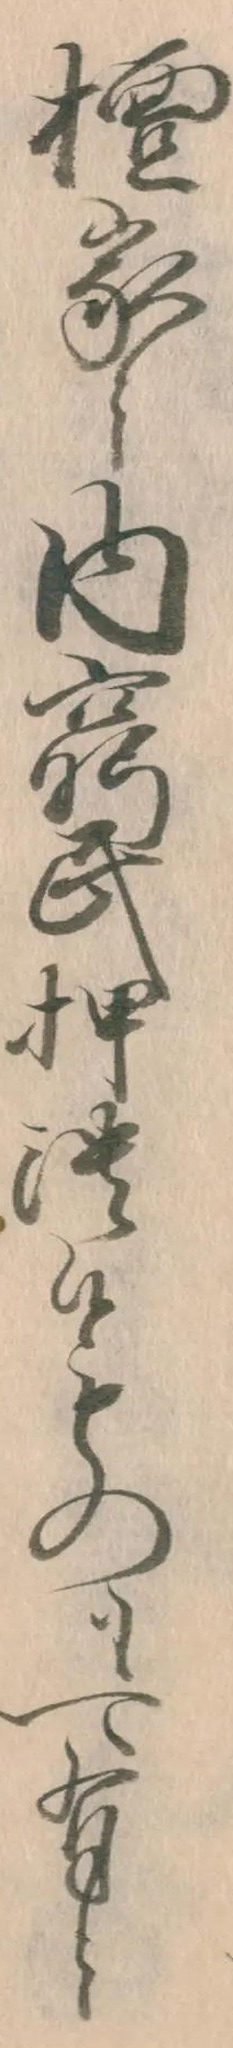檀家之内窮民押潰候ものも可有之
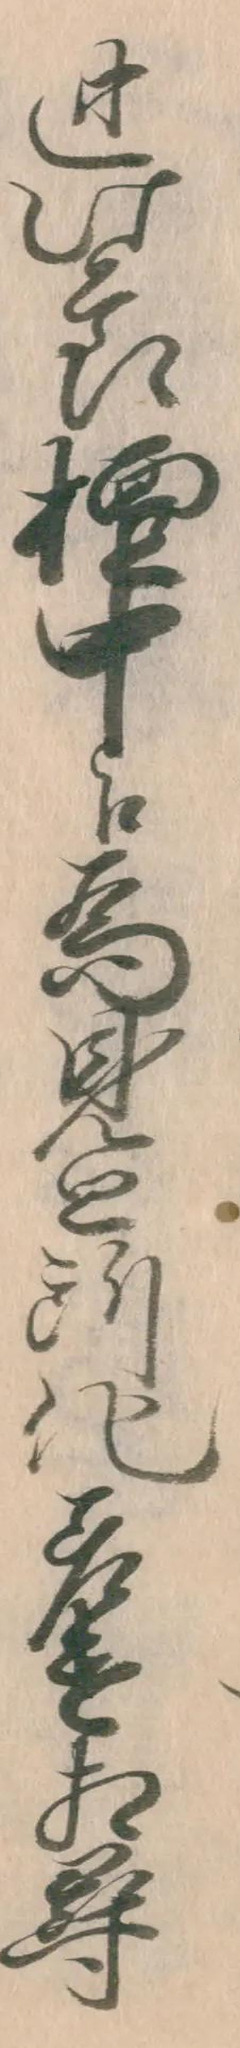迚此節檀中え為見廻所化差遣相尋
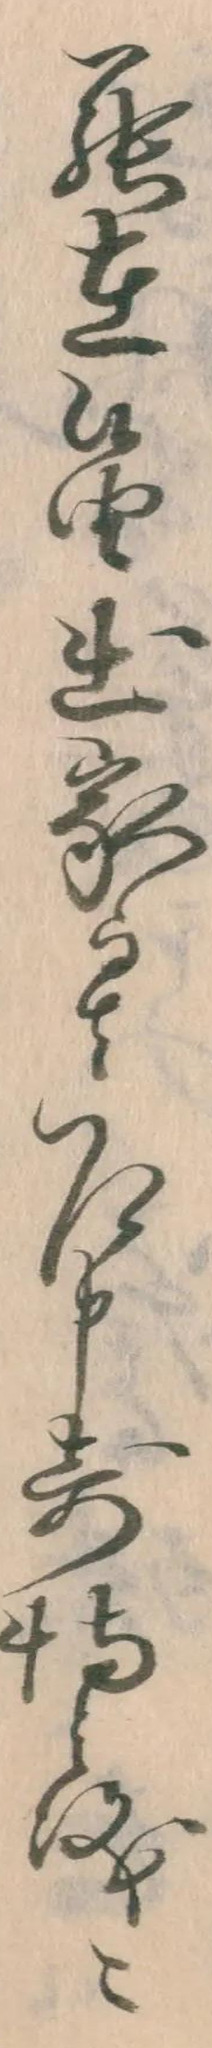罷在候由出家とは乍申奇特之儀ニ
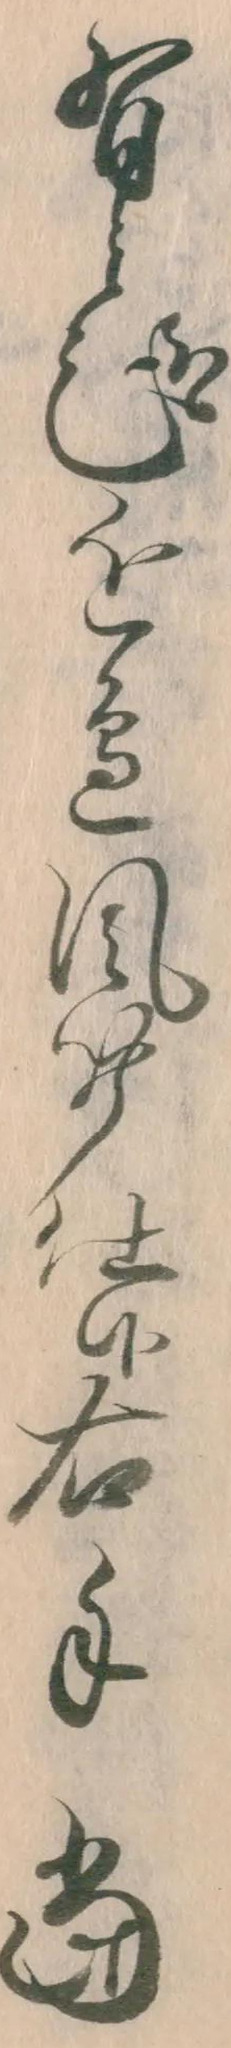有之趣近辺風聞仕候右手当
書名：武家方并寺院等ニテ施差出候一件
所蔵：国立国会図書館 National Diet Library, JAPAN
